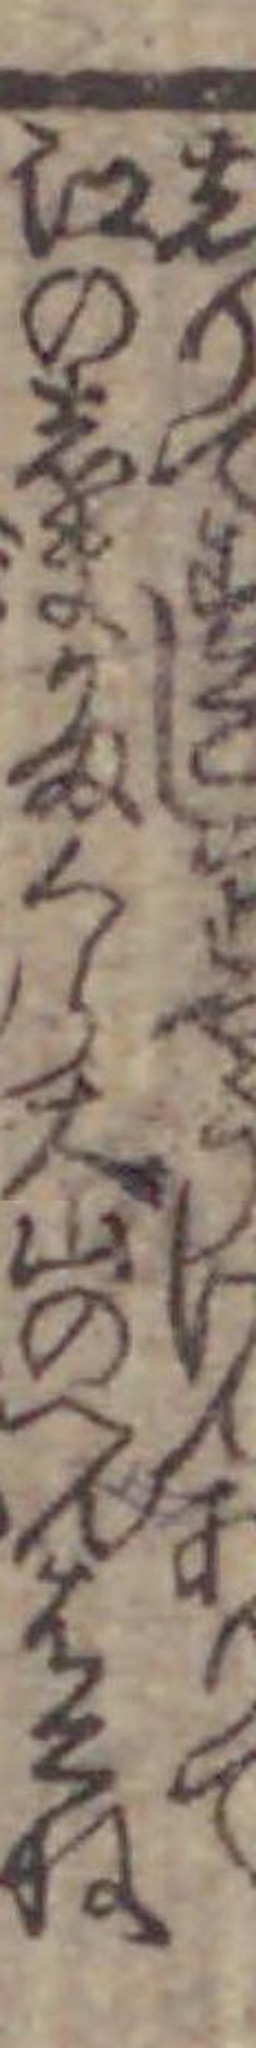江の島かまくら大山のへんはこね
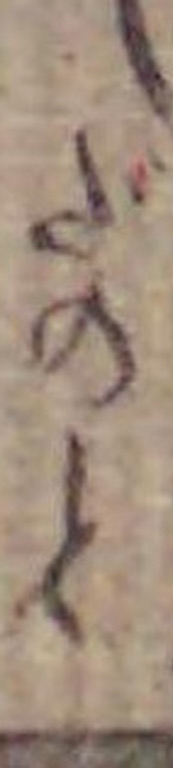だのと
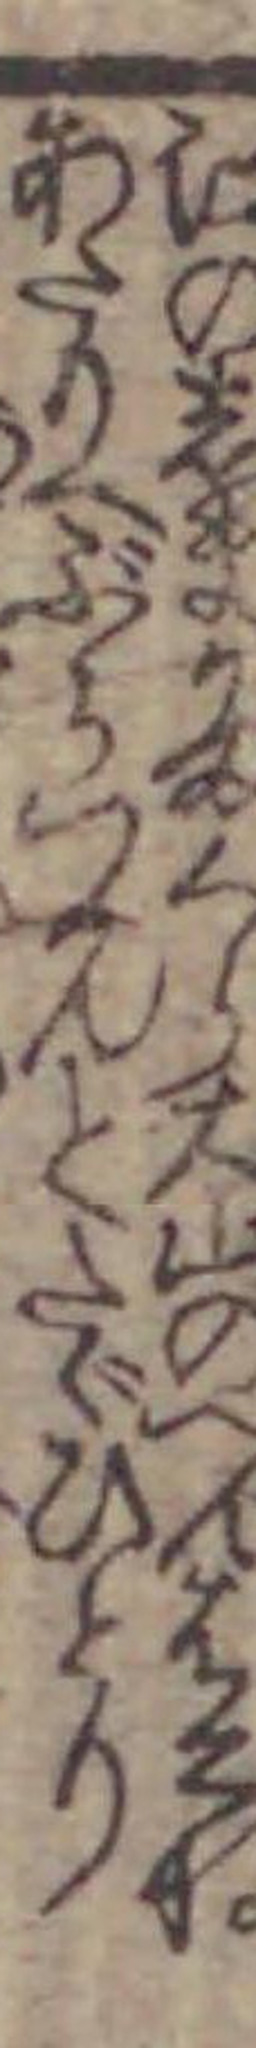あたりへぶらつかんとたゞひとり
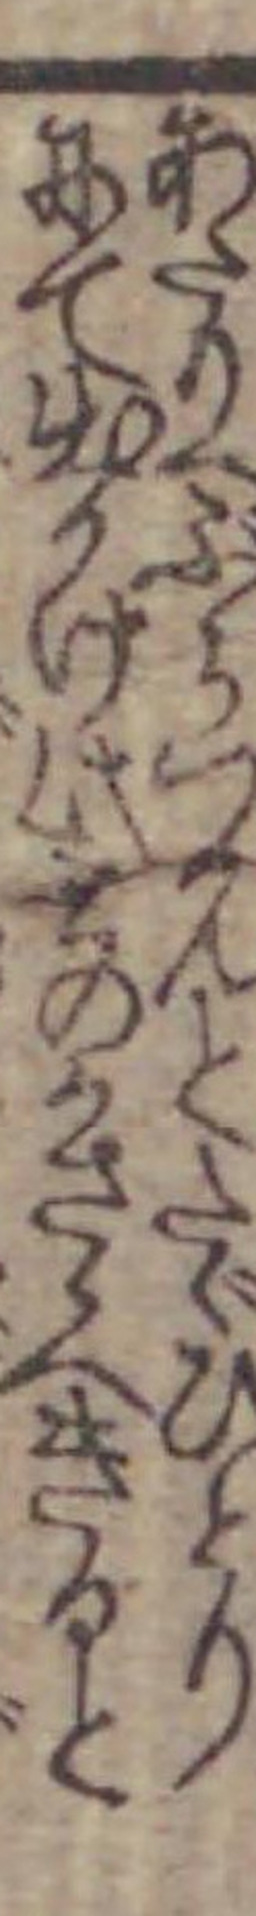にて出かけ此みのかさゝへきると
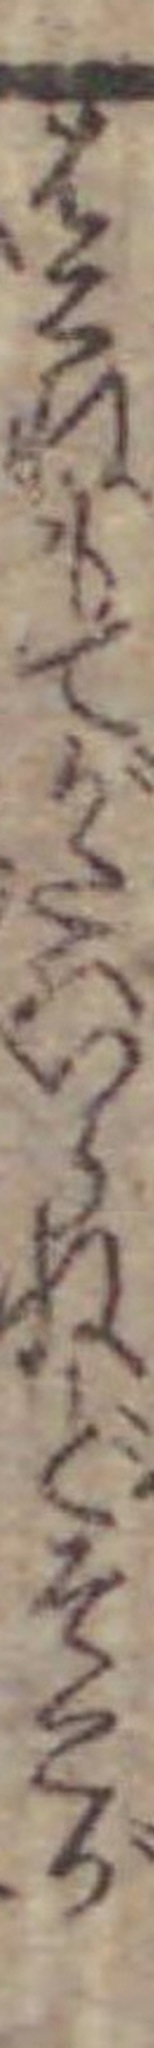はこねもてがたはいらねどそこが
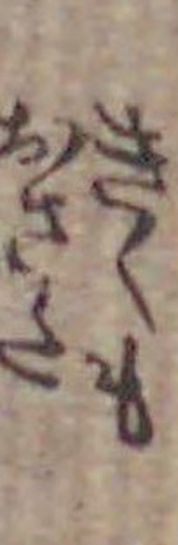おさた
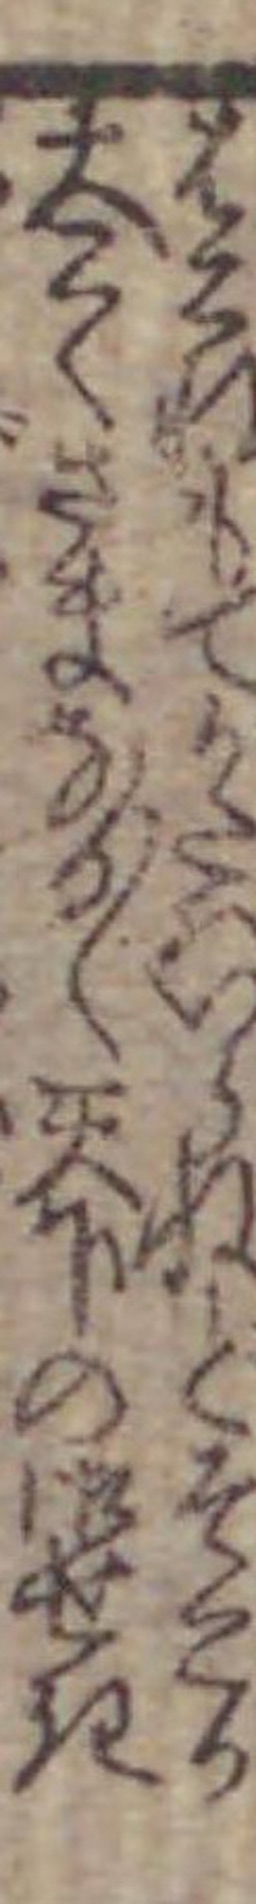大こくさまなか〳〵天下の御せき
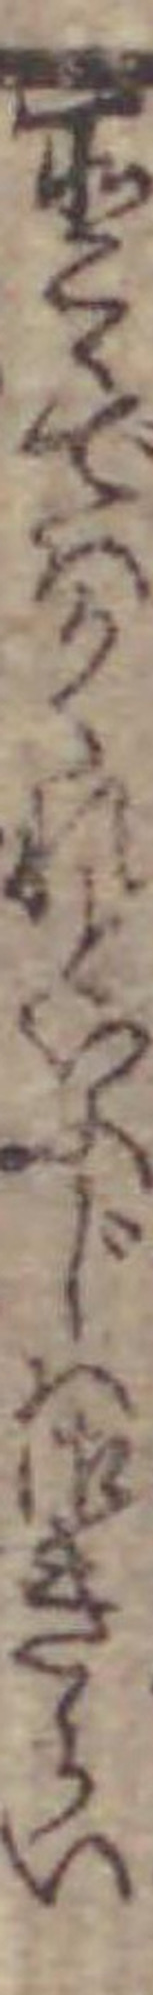所こゝではかくれといふじは御きらい
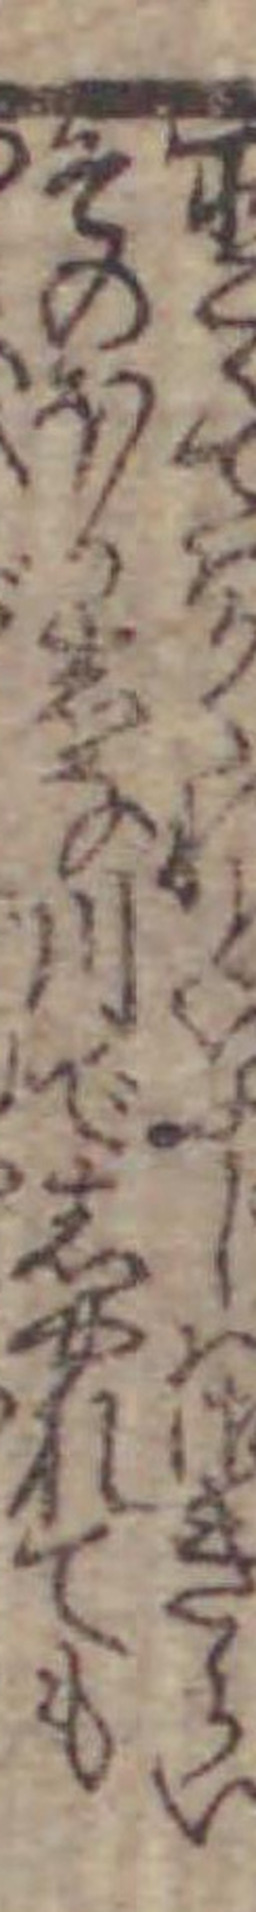そのほかしな川でしやれても
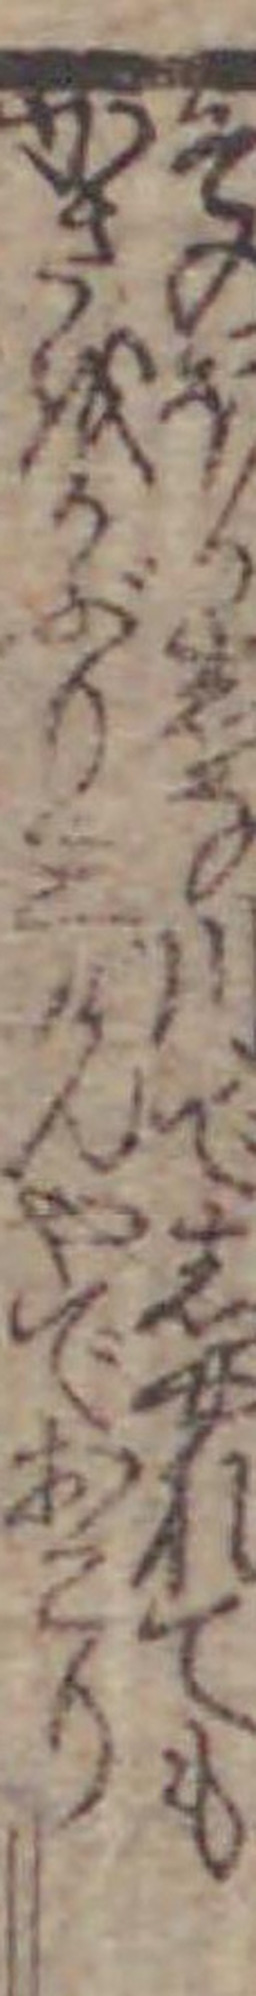かさをかぶり三げんやでおこり
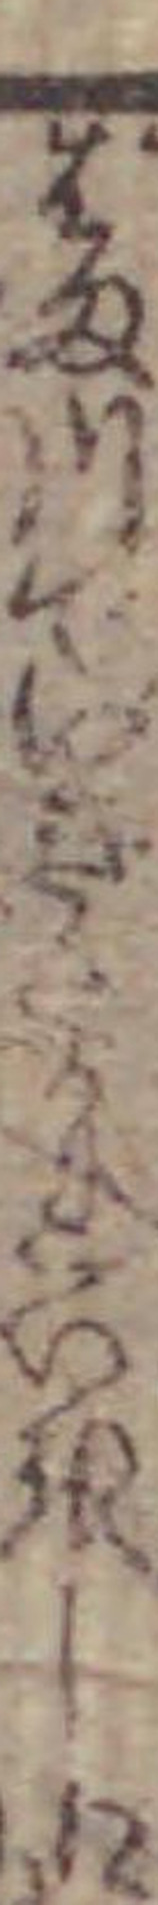はま川でいきたかれいをし
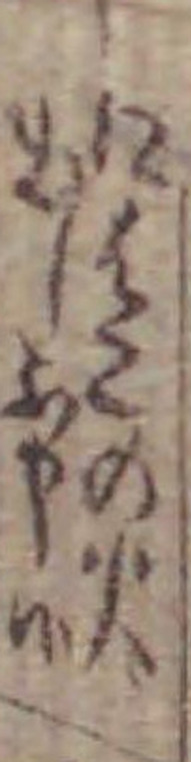たはこの火
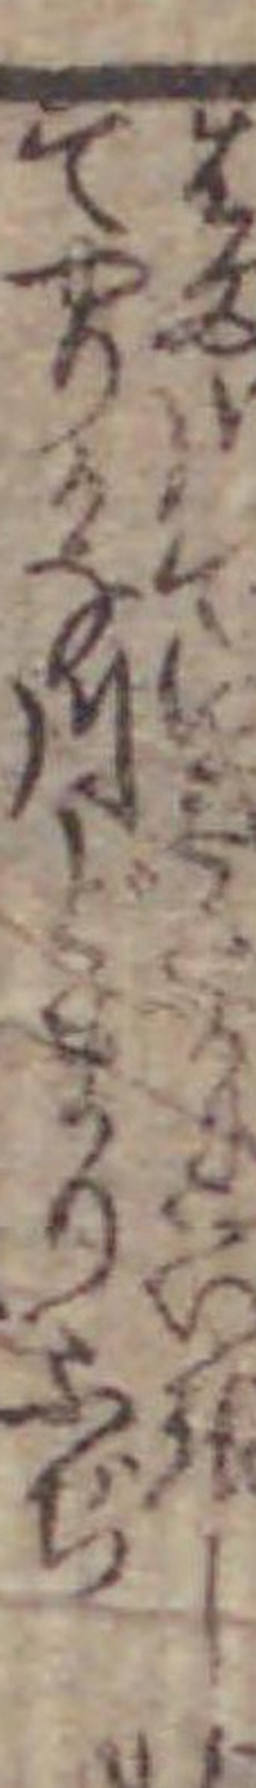てやりかな川どまりふぢ
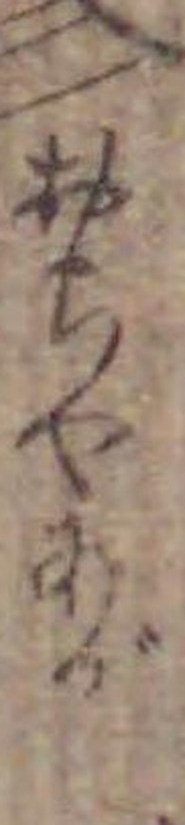おちやあが
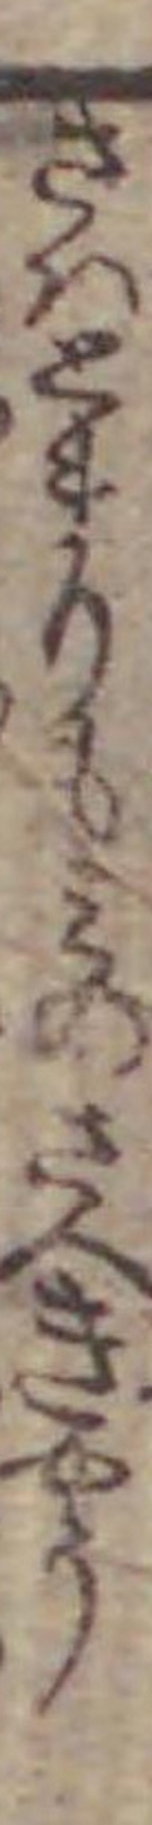さはとまりもみのさへきやう
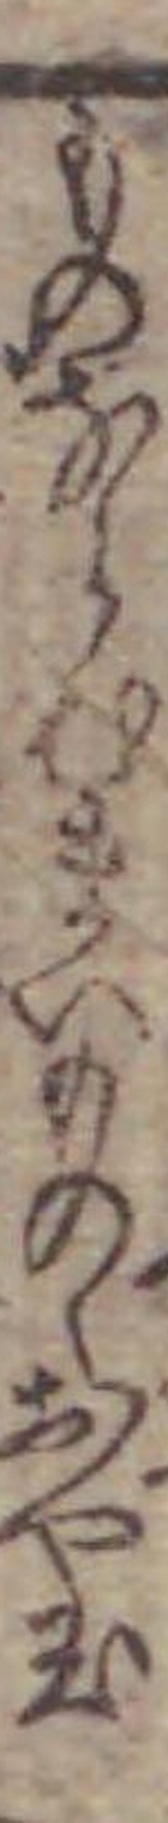ものならむまいものゝおや玉
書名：即席耳学問 : 3巻
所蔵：国立国会図書館 National Diet Library, JAPAN
